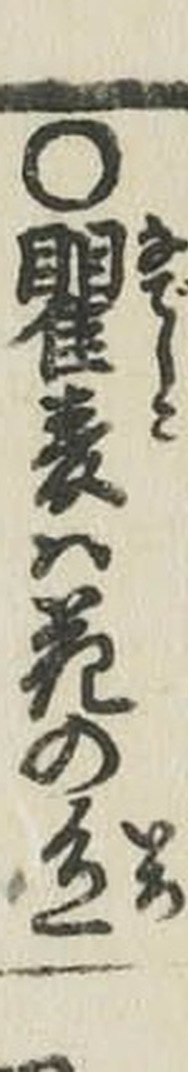○瞿麦は花の色
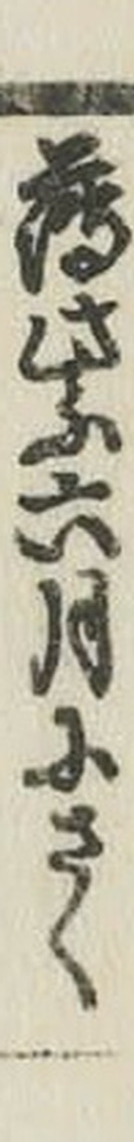薄紫六月にさく
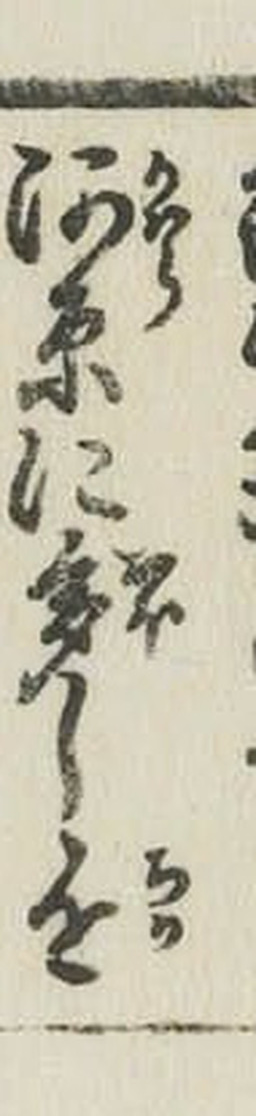河原に多し近
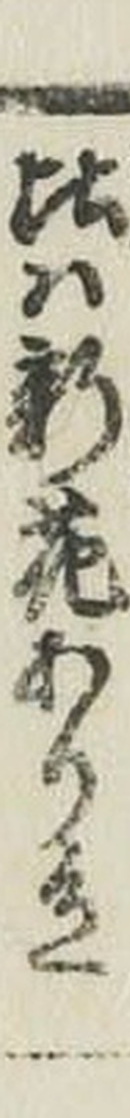頃は新花あり色
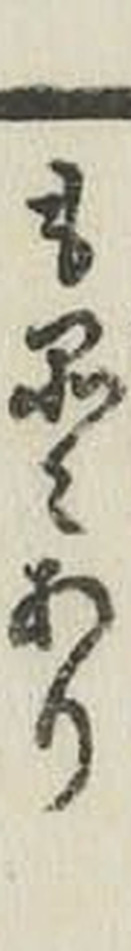も品々あり
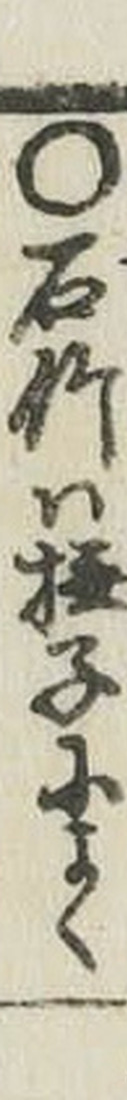○石竹は撫子によく
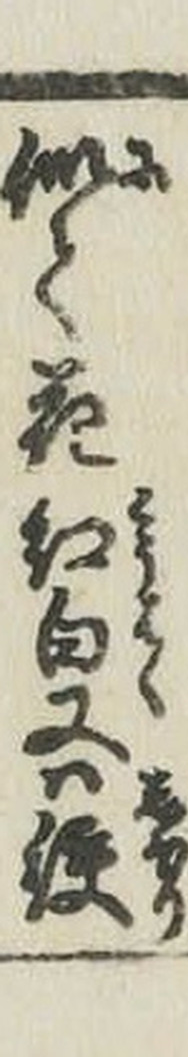似て花紅白又は絞
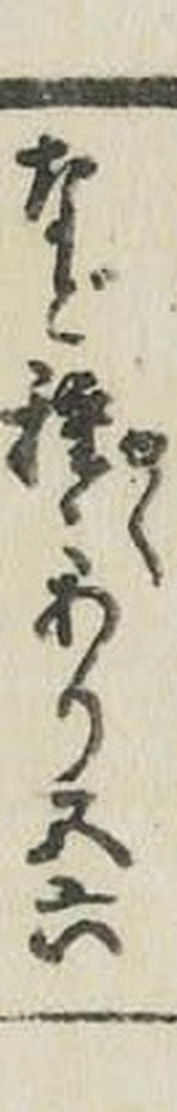など種々あり又六
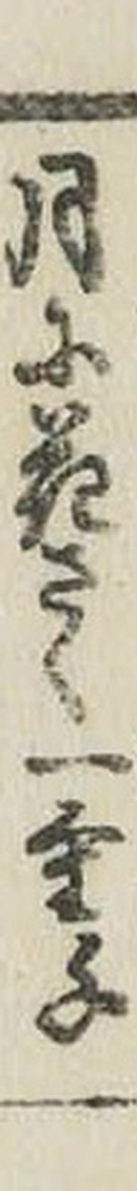月に花さく一重千
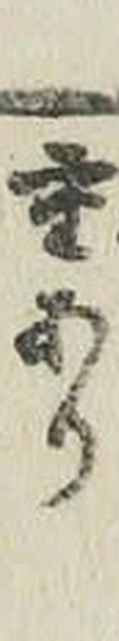重あり
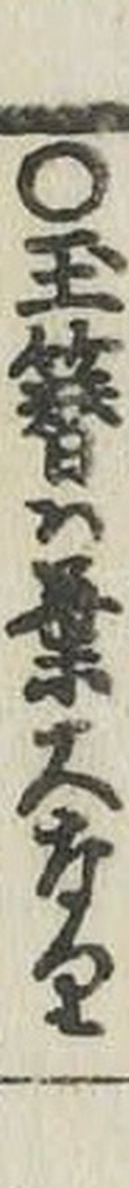○玉簪は葉大なり
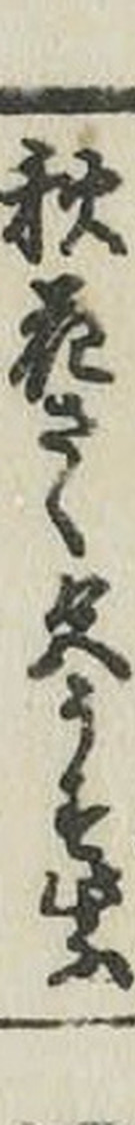秋花さく色うす紫
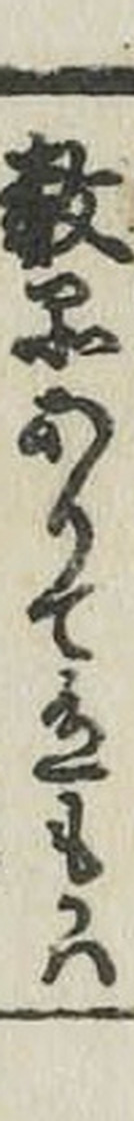数品ありて色もかは
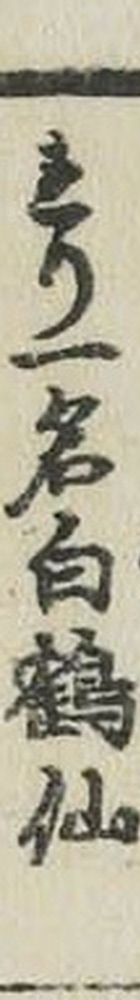れり一名白鶴仙

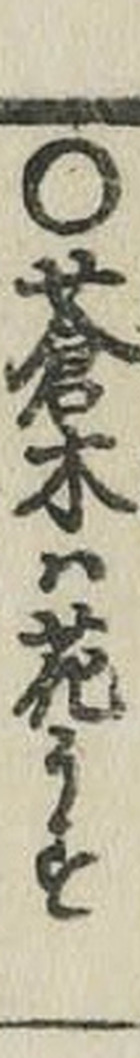○蒼朮は花うす
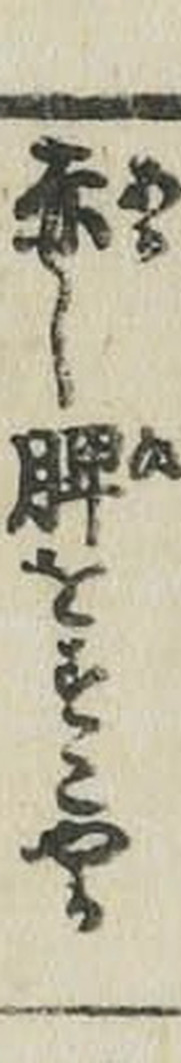赤し脾をすこやか
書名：増補頭書訓蒙図彙大成 10巻 9:巻之20
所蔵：東京学芸大学教育コンテンツアーカイブ
